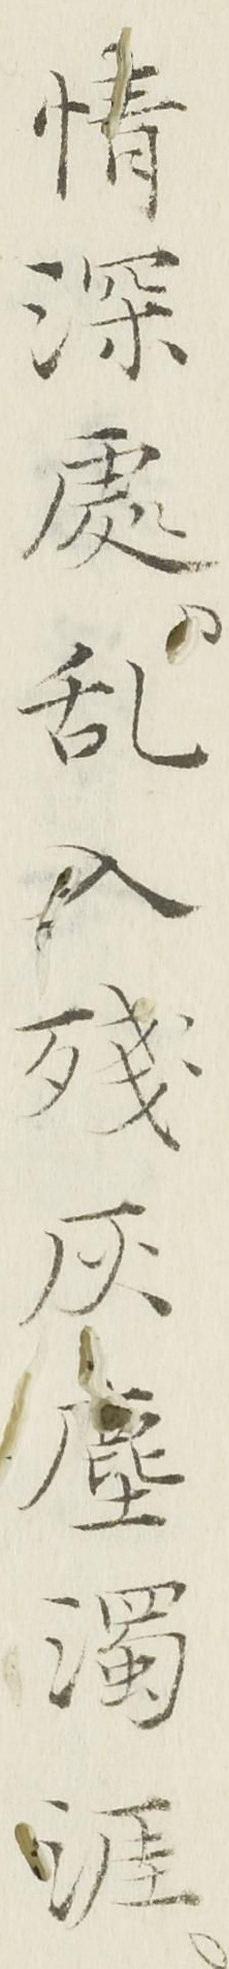情深処乱入残灰塵濁涯
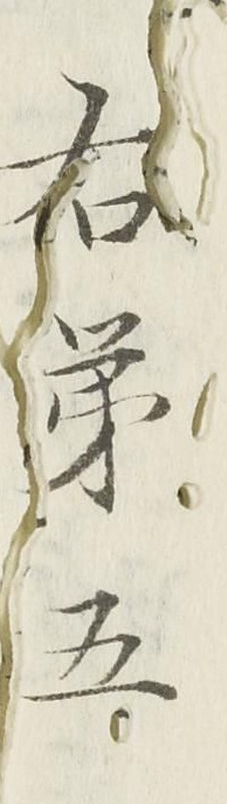右第五
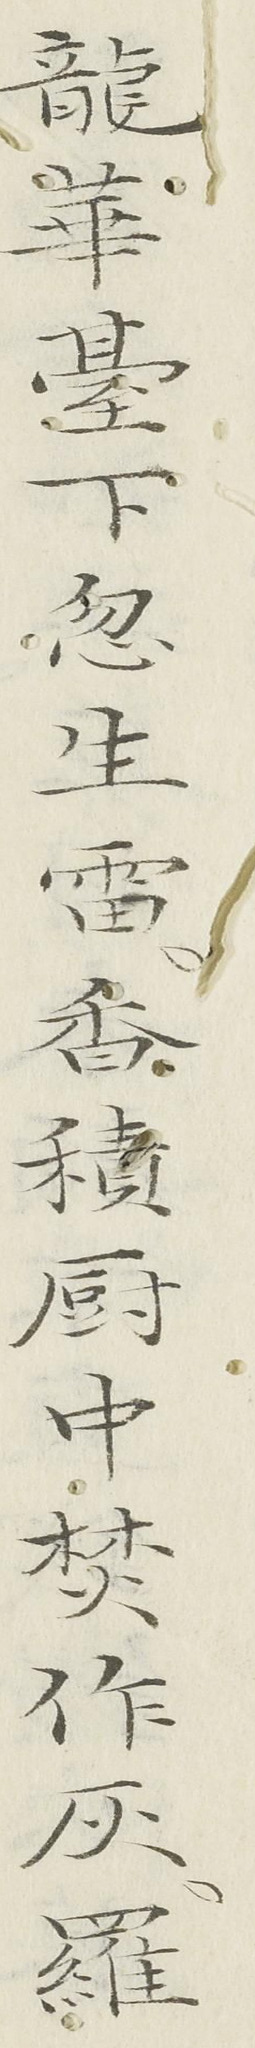龍華台下忽生雷香積厨中焚作灰羅
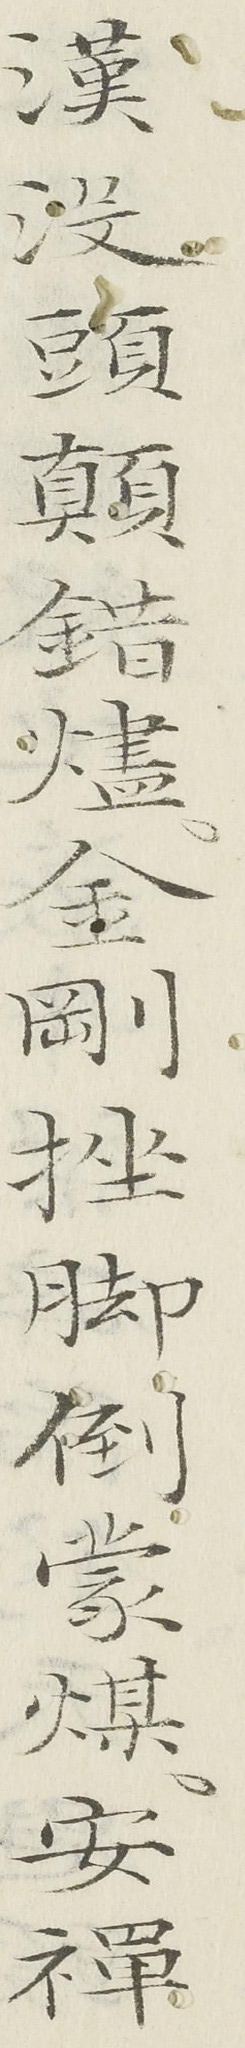漢没頭顛錯燼金剛挫脚倒蒙煤安禅
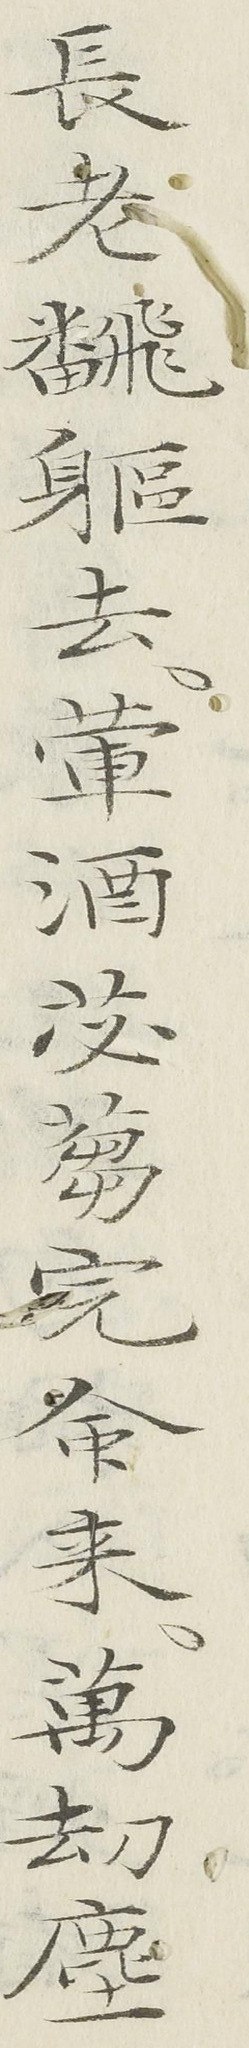長老翻躯去葷酒苾蒭完命来万劫塵
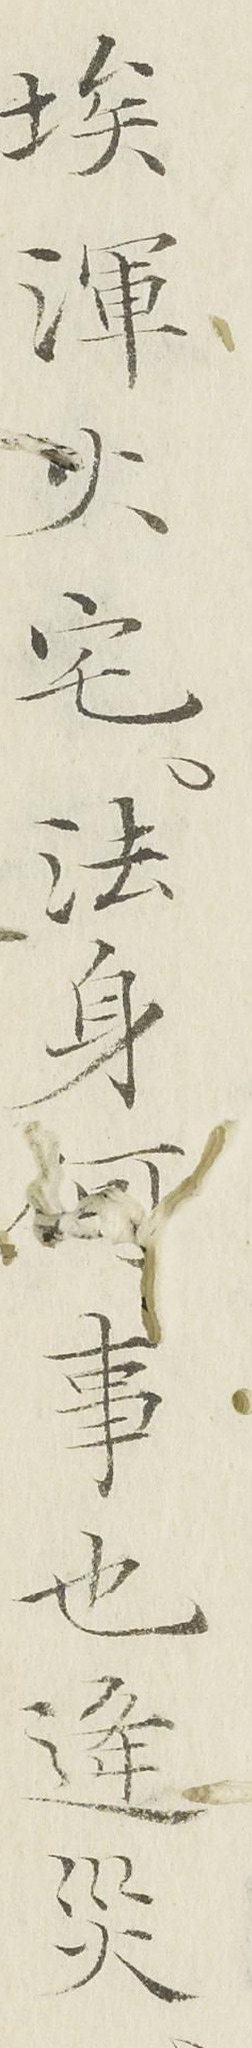埃渾火宅法身何事也逢災

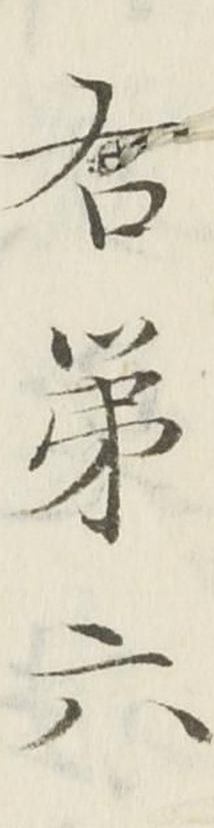右第六
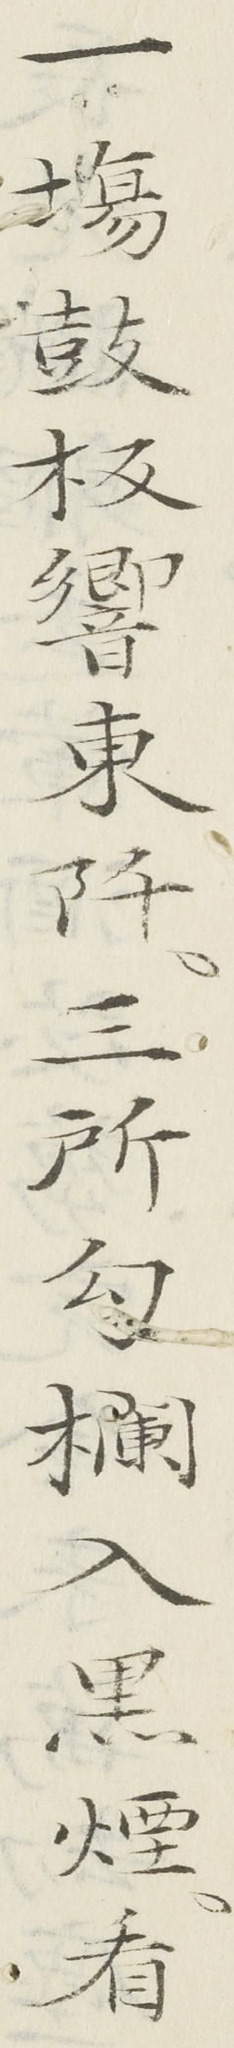一場鼓板響東阡三所勾欄入黒煙看
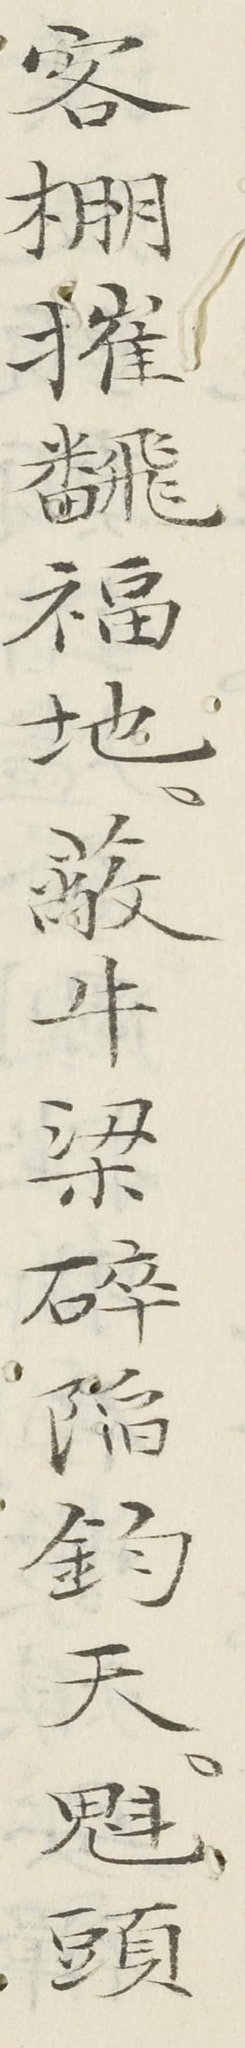客棚摧翻福地蔽年梁砕陥釣天魁頭
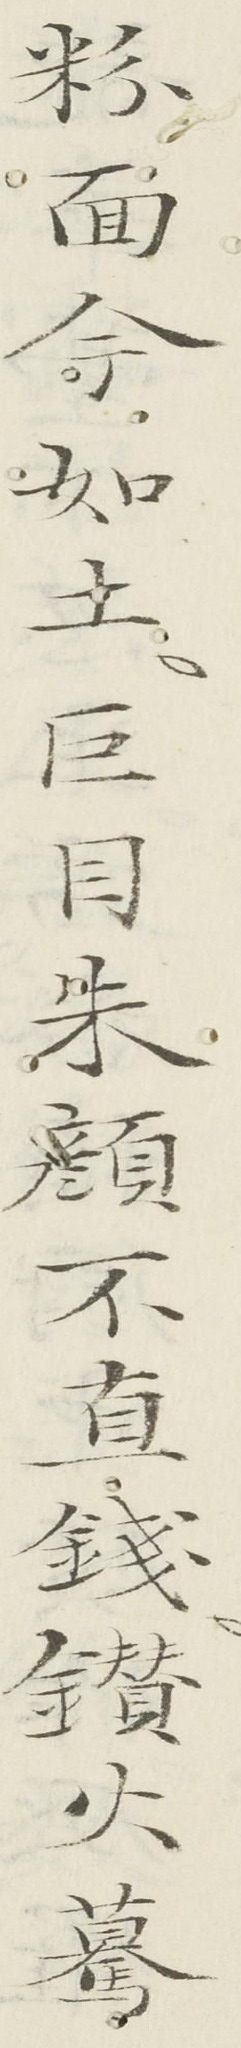粉面今如土巨目顔不真銭鑚火驀
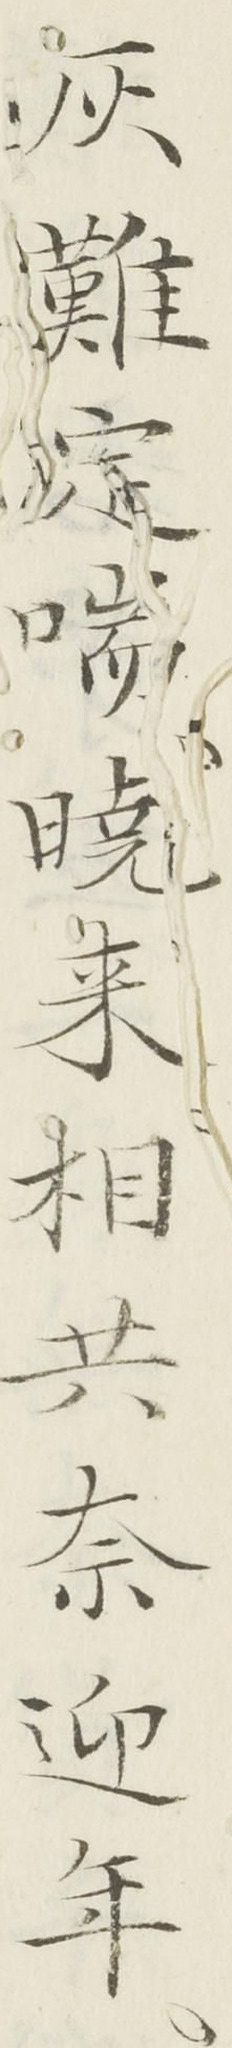灰難定喘暁来相共奈迎年
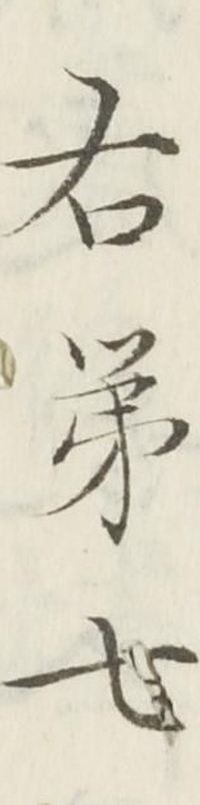右第七
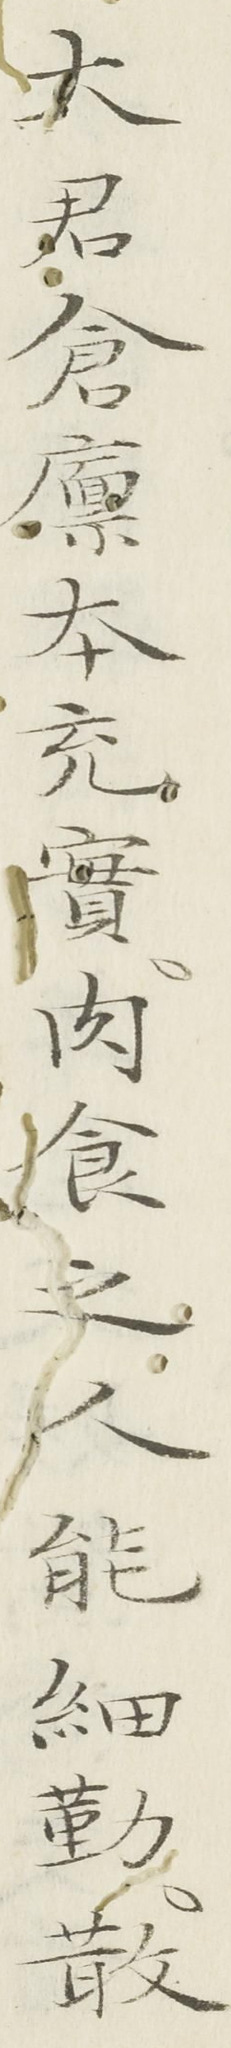大君倉廩本充実肉食之人能細勤散
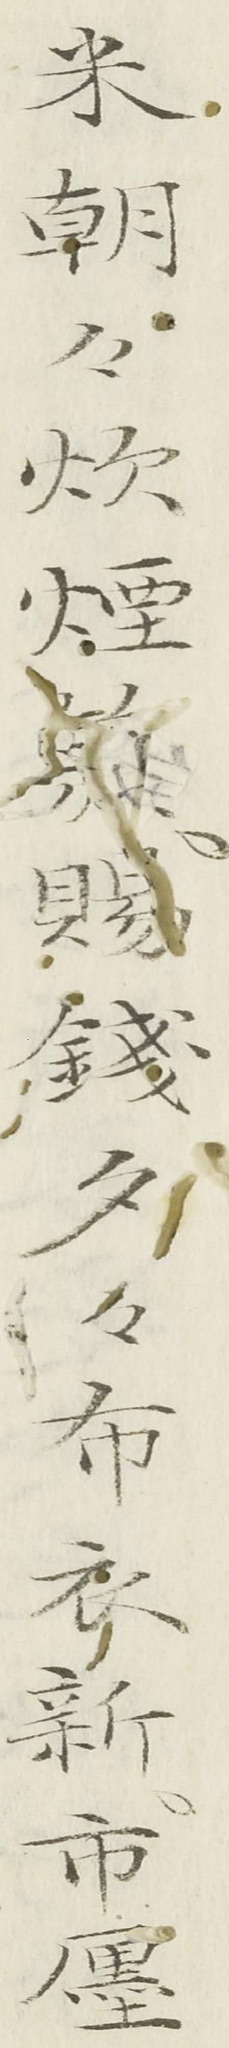米朝々炊煙賜銭タ々布衣新市㕓
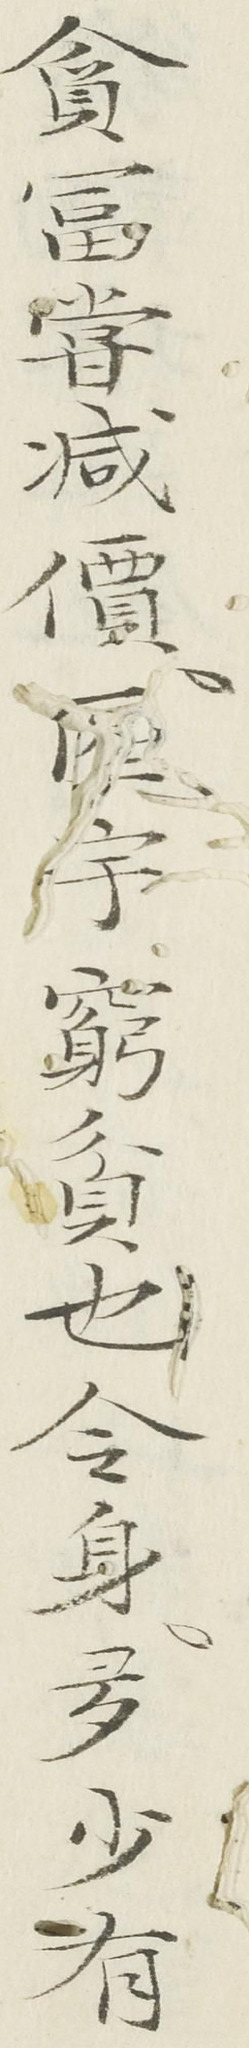貧富甞減価宇窮貧也令身多少有
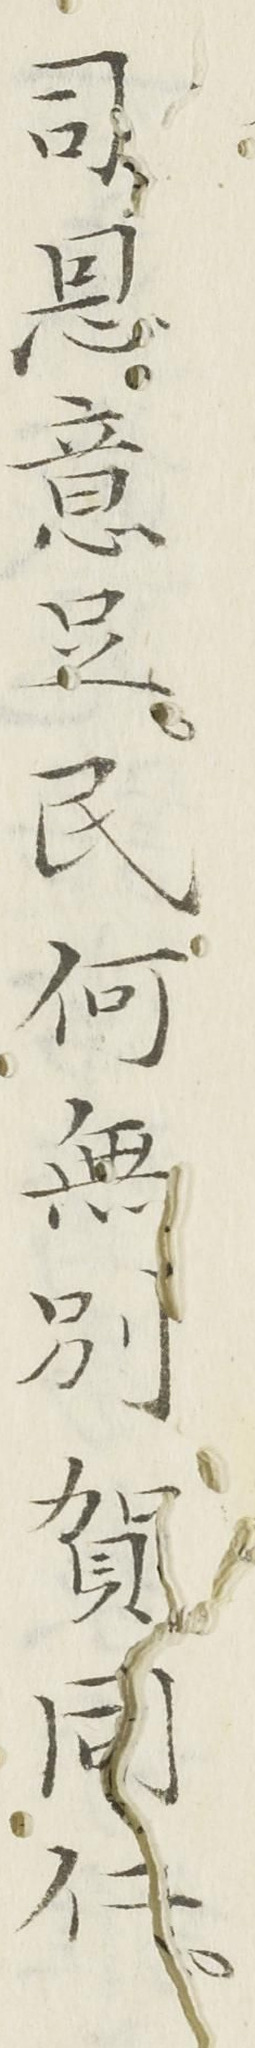司恩意足民何無別賀同仁
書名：地震考證　全
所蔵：東京大学地震研究所図書室 Earthquake Research Institute Library, The University of Tokyo, JAPAN
